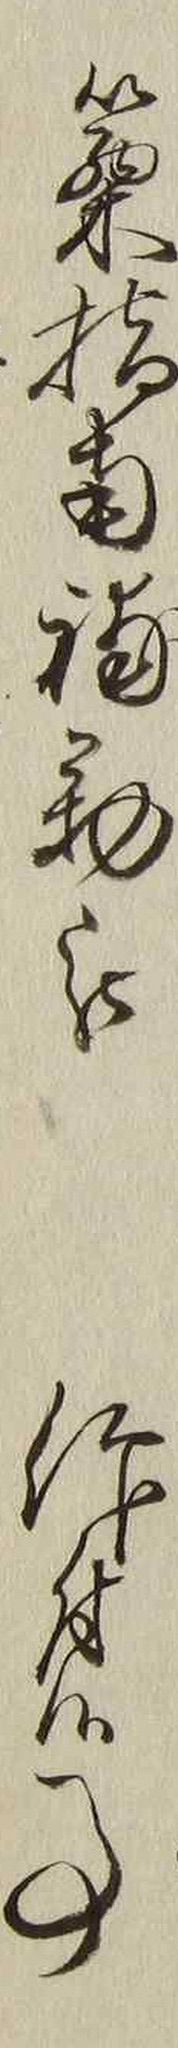篥指南補勤被仰付候事
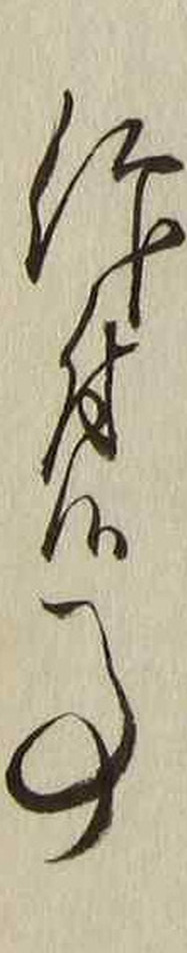仰付候事
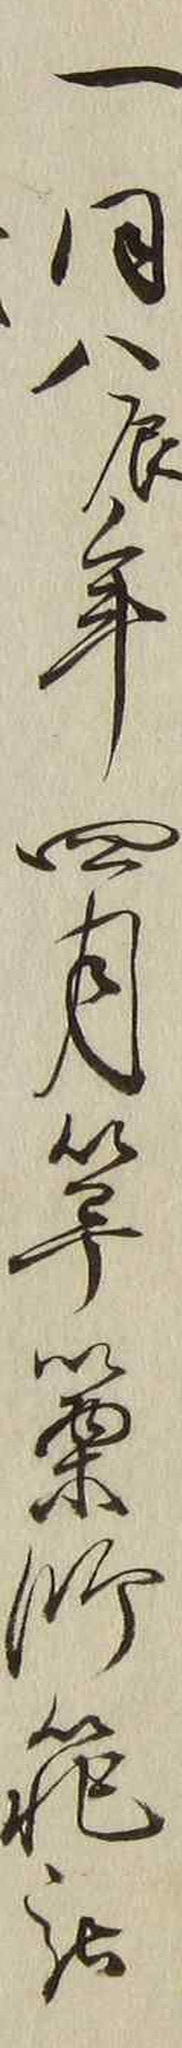一同八辰年四月篳篥師範被
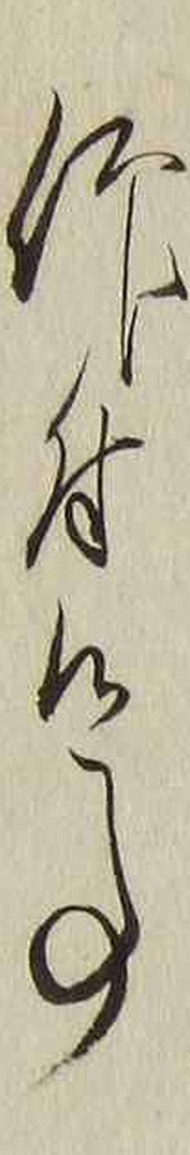仰付候事

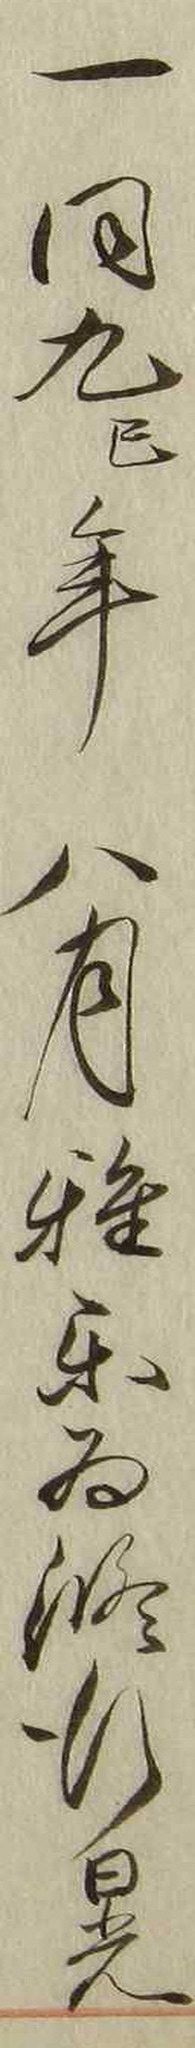一同九巳年八月雅楽為修行日光
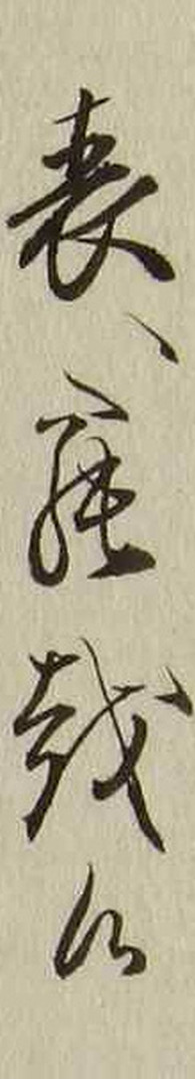表へ罷越候
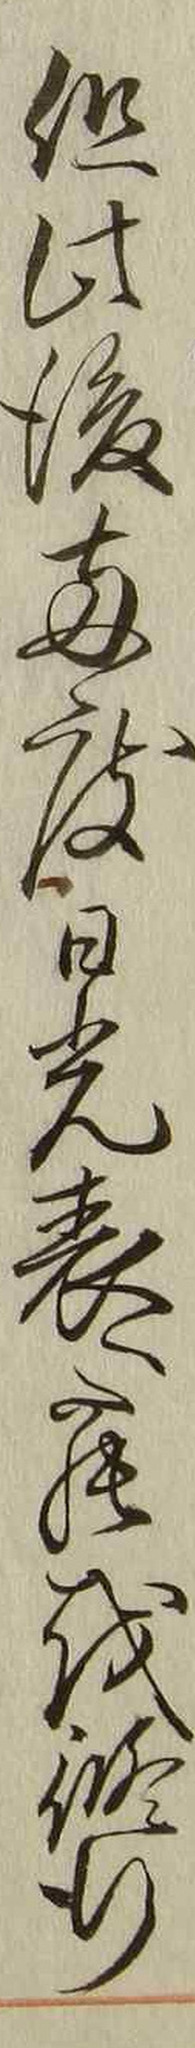但此後両度日光表へ罷越修行
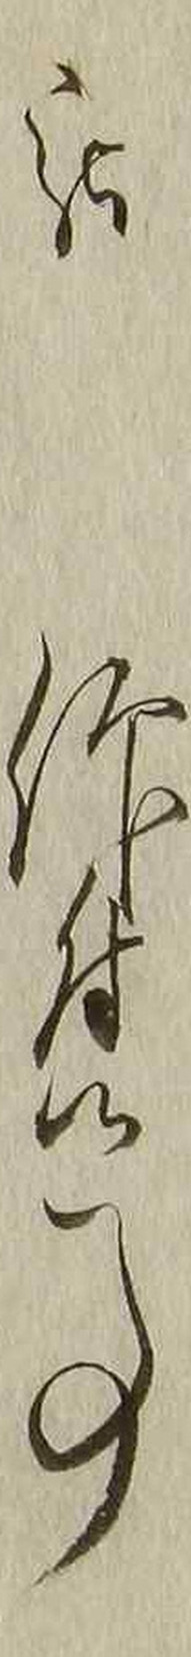被仰付候事
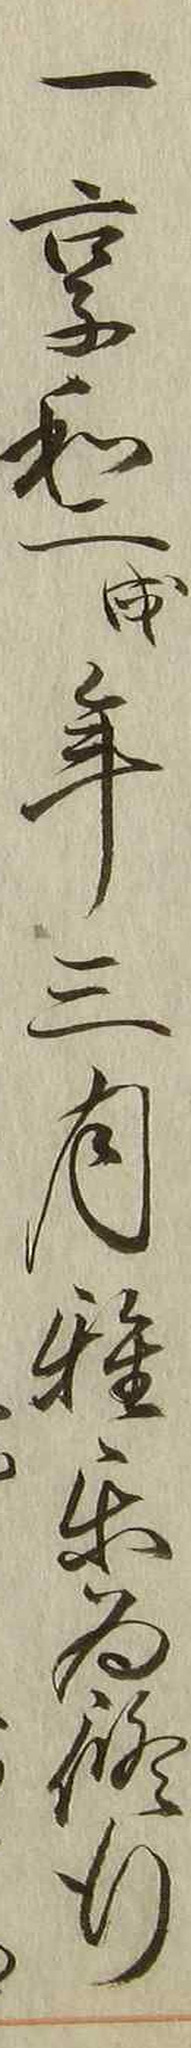一享和二戌年三月雅楽為修行
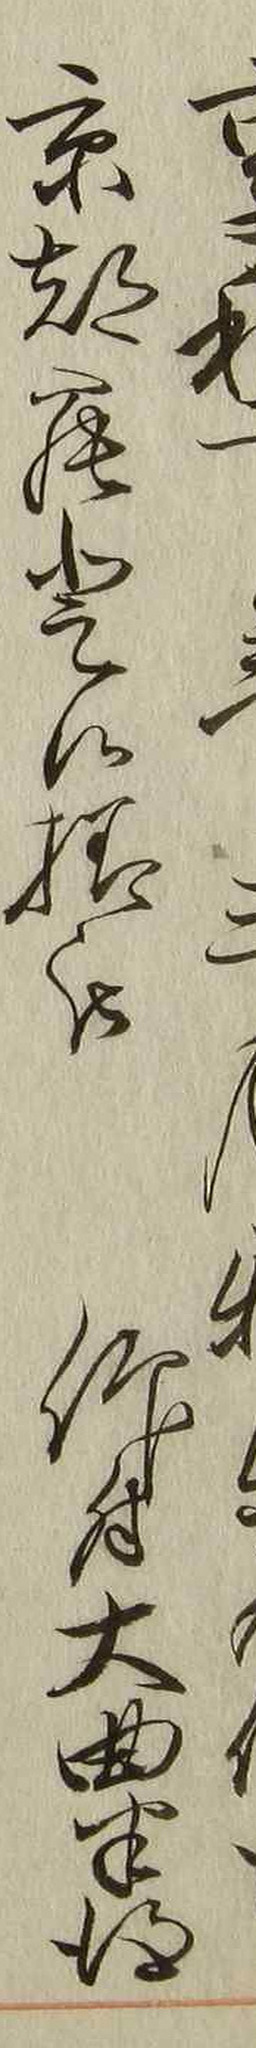京都罷登候様被仰付大曲半得
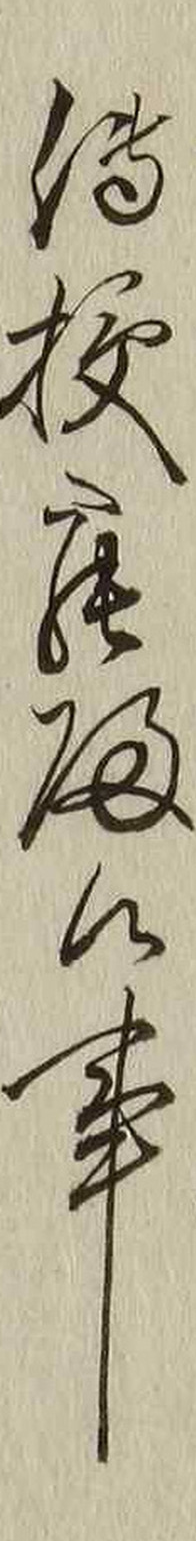伝授罷帰候事
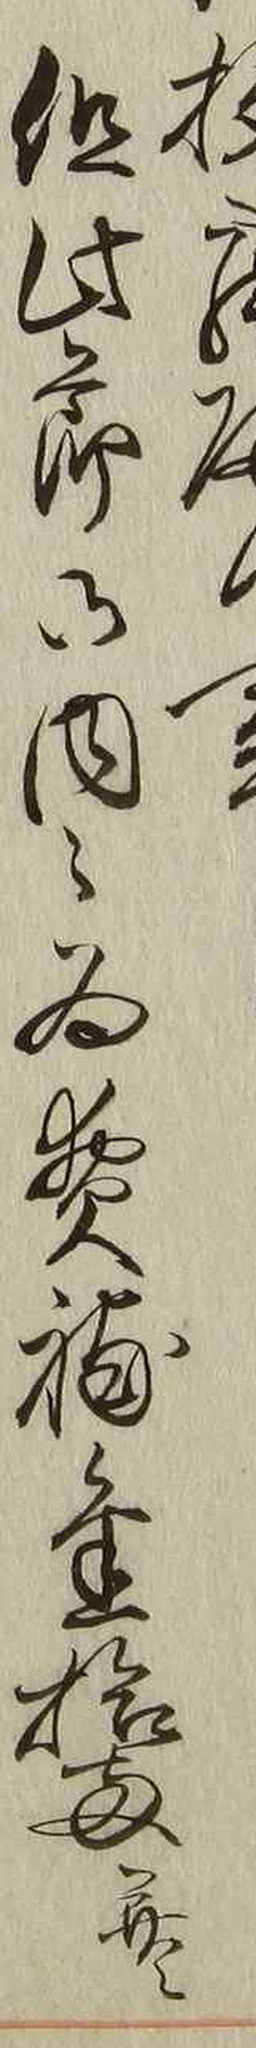但此節御内々為費補金拾両并ニ
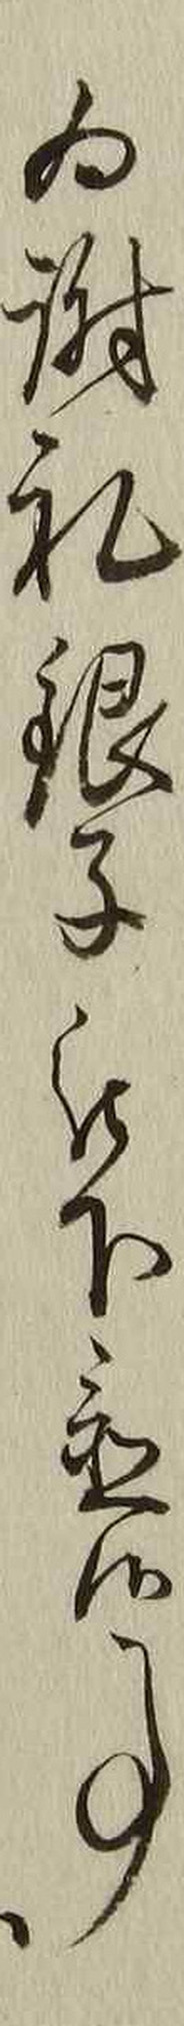為謝礼銀子被下置候事
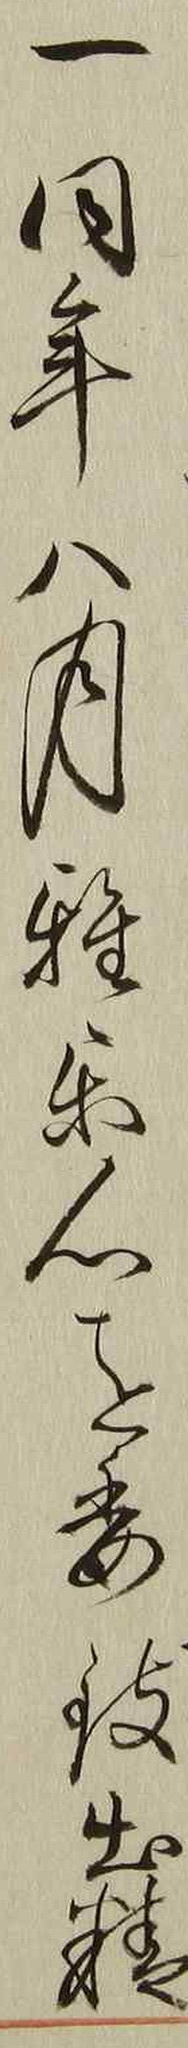一同年八月雅楽心を委致出精
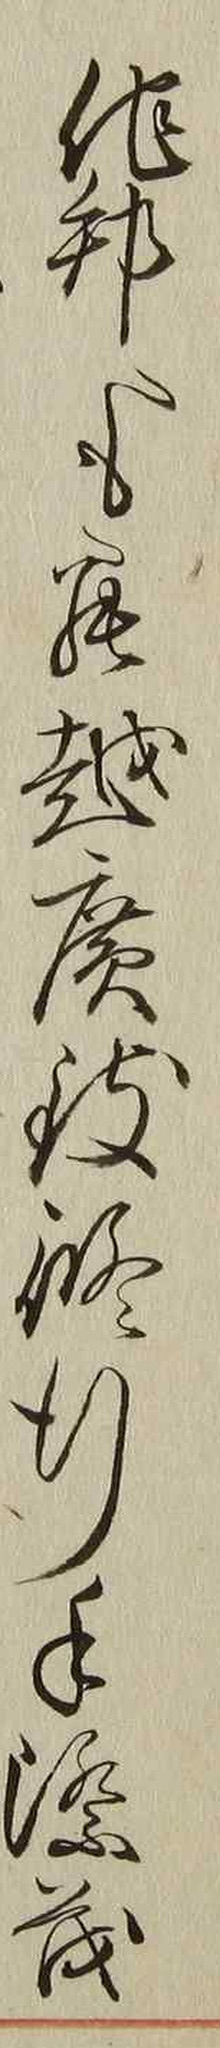他邦へも罷越広致修行手際茂
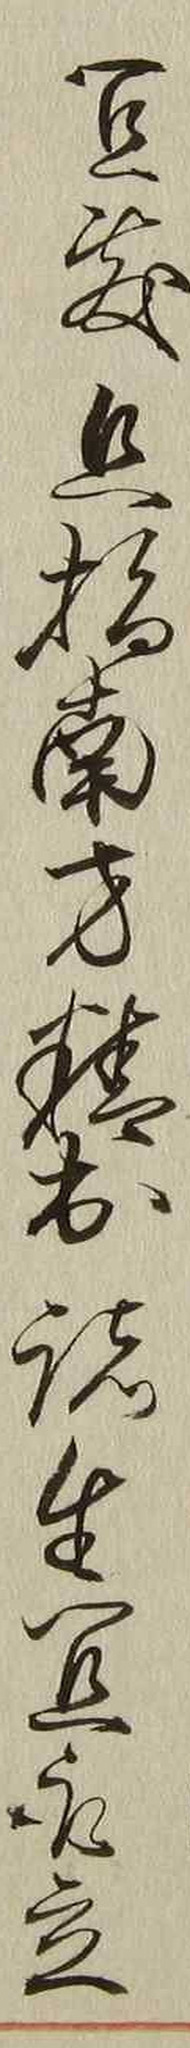宜敷且指南方精出諸生宜取立
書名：諸士系譜　巻之57　ほ之部4
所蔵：会津若松市立会津図書館
